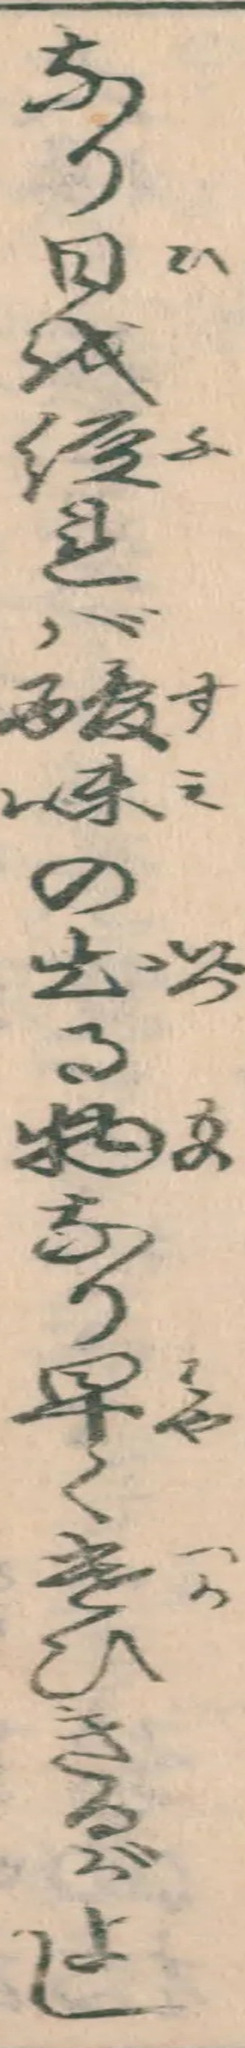なり日を経れば酸味の出る物なり早く遣ひきるがよし
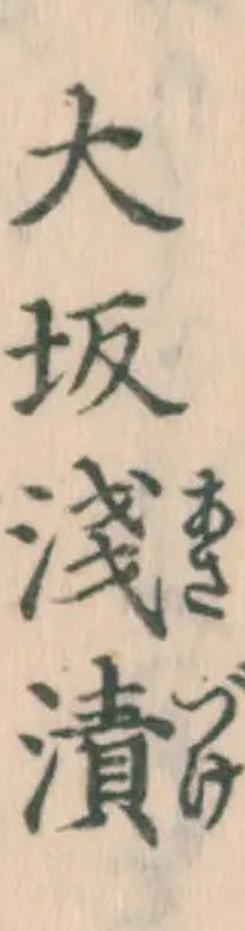大坂浅漬
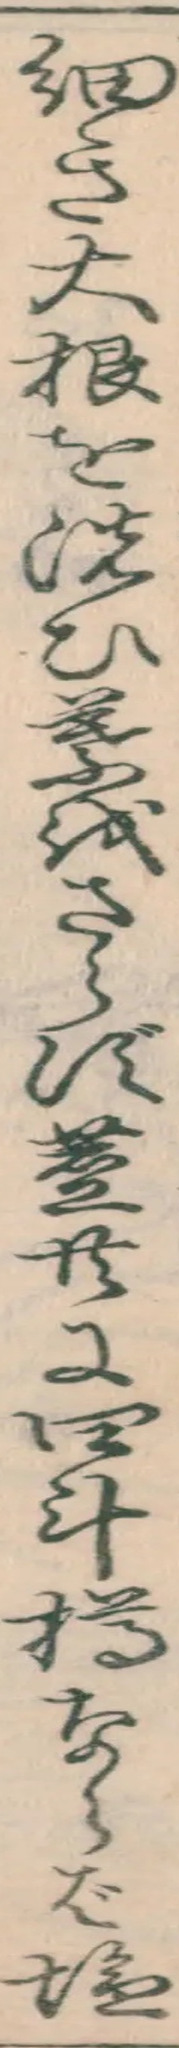細き大根を洗ひ葉をさらず茎共に四斗樽ならば塩
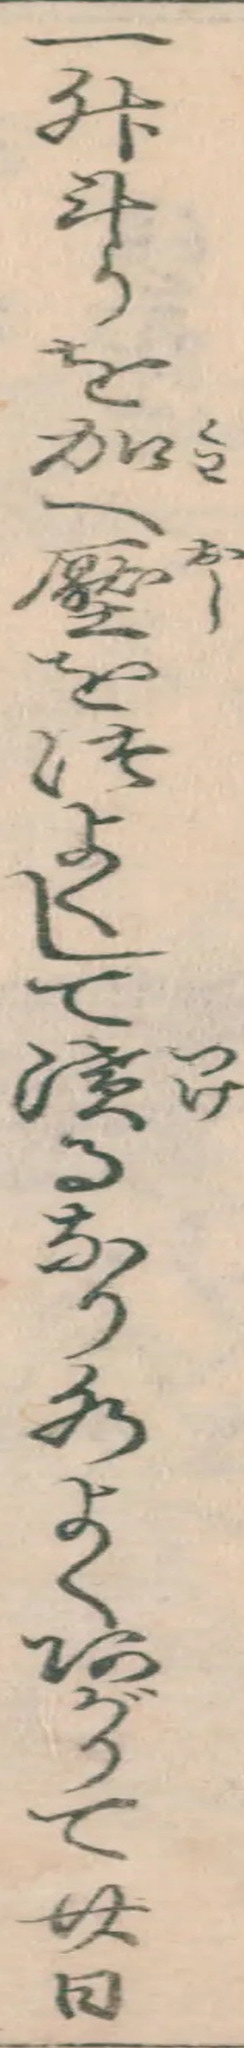一升斗りを加へ圧をつよくして漬るなり水よくあがりて廿日
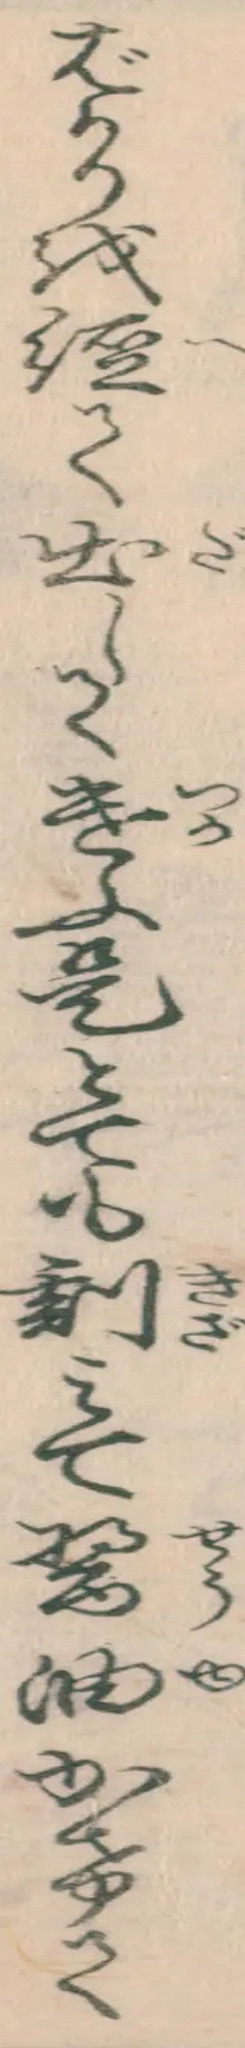ばかりを経て出して遣ふ是とても刻みて醤油かけて
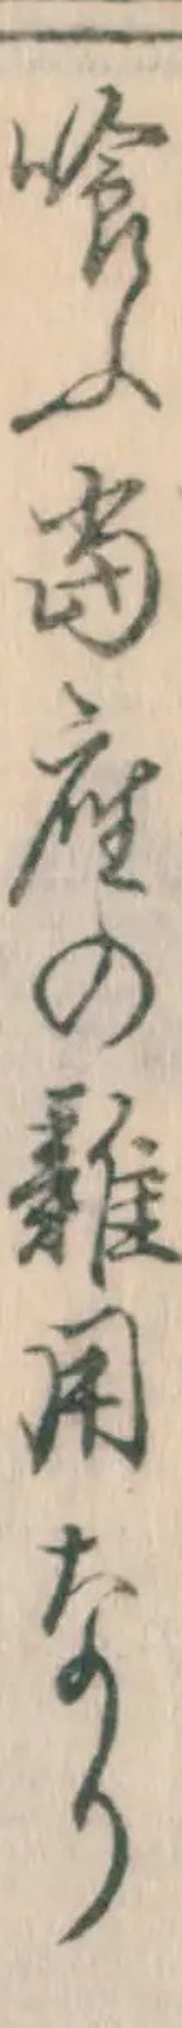喰ふ当座の雑用なり
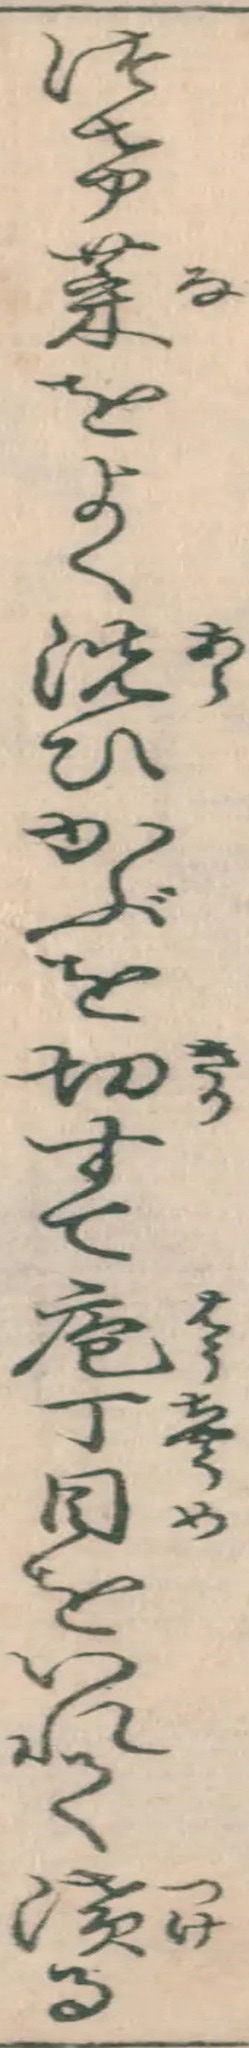つけ菜をよく洗ひかぶを切すて庖丁目をいれて漬る
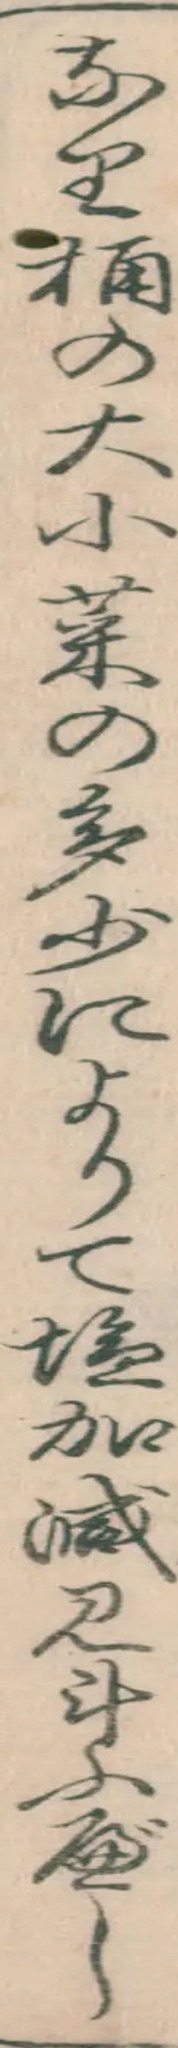なり桶の大小菜の多少によりて塩加減見斗ふべし

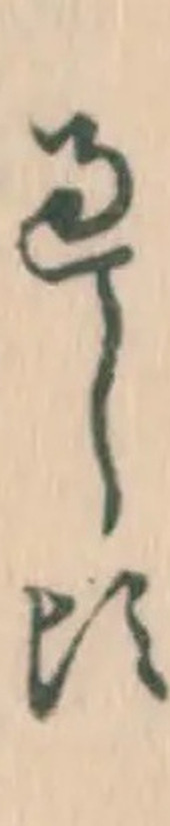過し頃
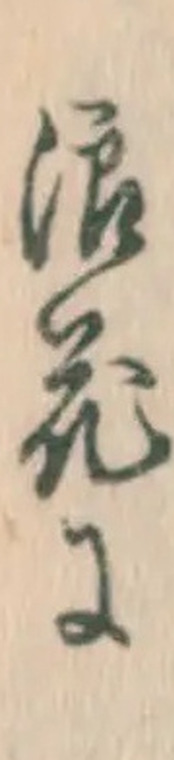浪花に
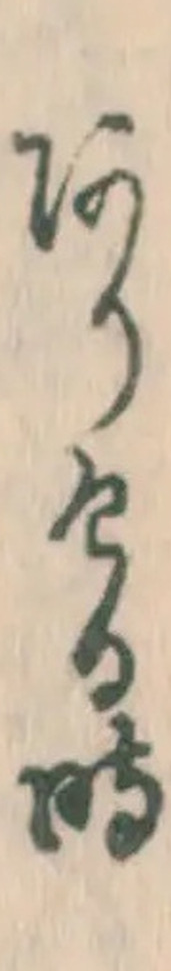ありける時
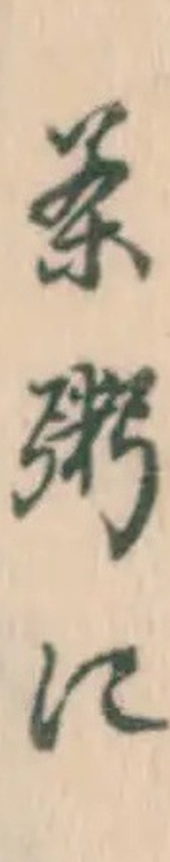茶粥に
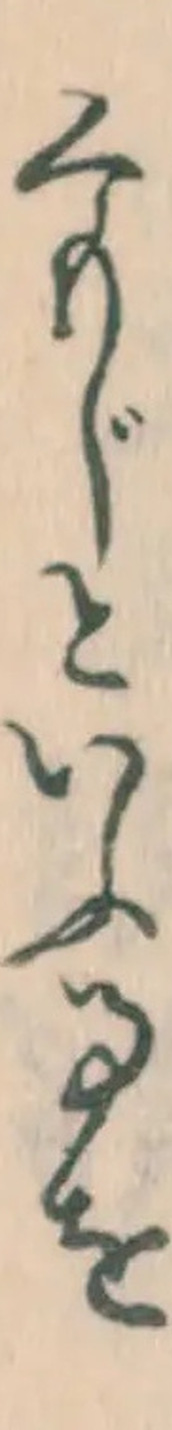くもじといふ事を
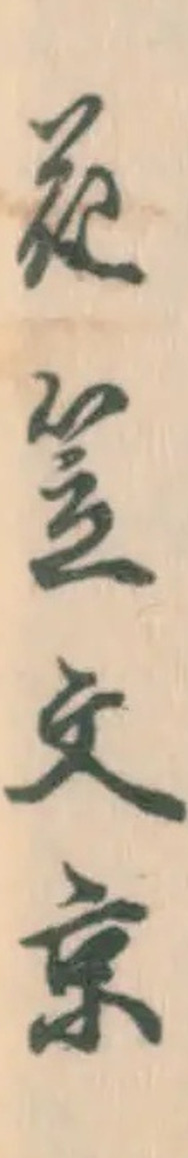花笠文京
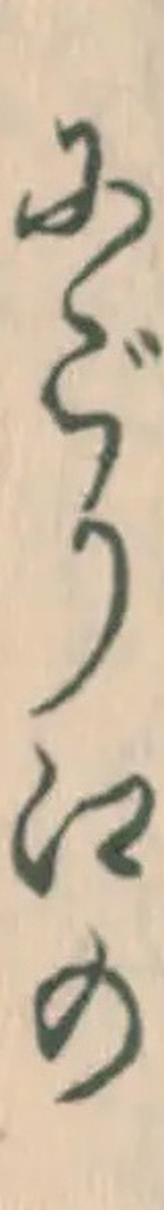にごり江の
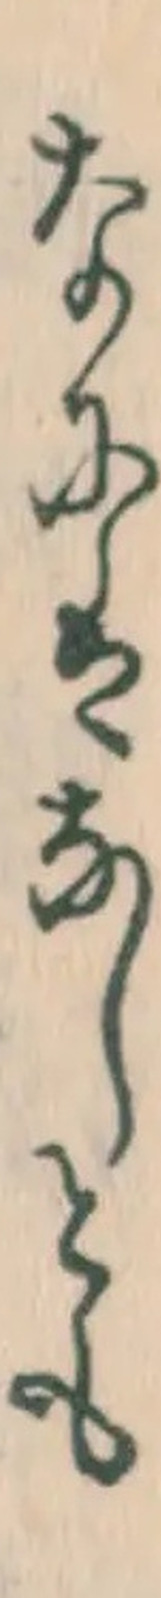なにはなしとも
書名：四季漬物鹽嘉言
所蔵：国立国会図書館 National Diet Library, JAPAN
